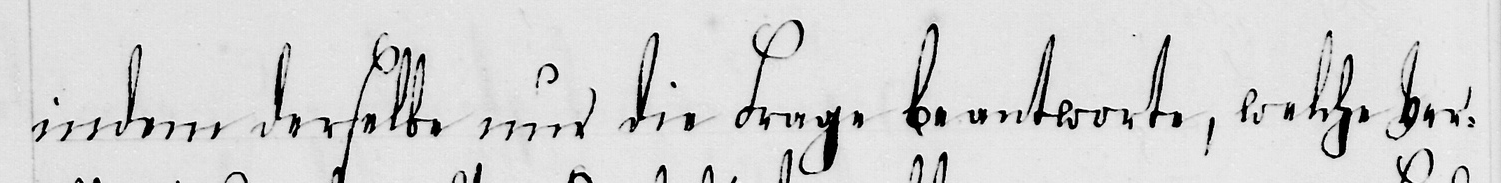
indem derselbe nur die Frage beantworte, welche Ve¬
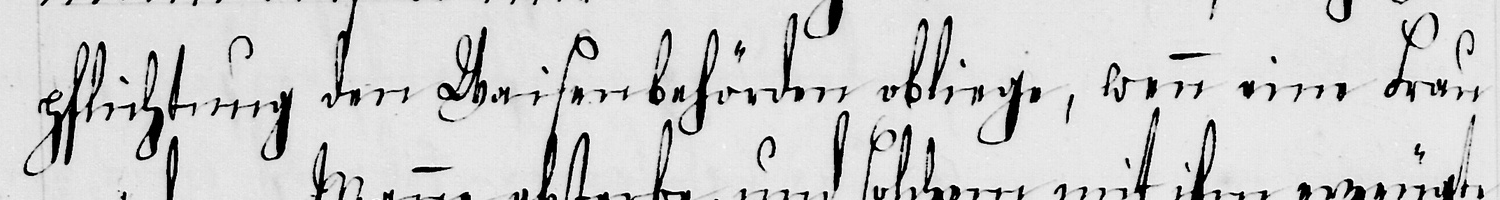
rpflichtung den Waisenbehörden obliege, wenn eine Frau
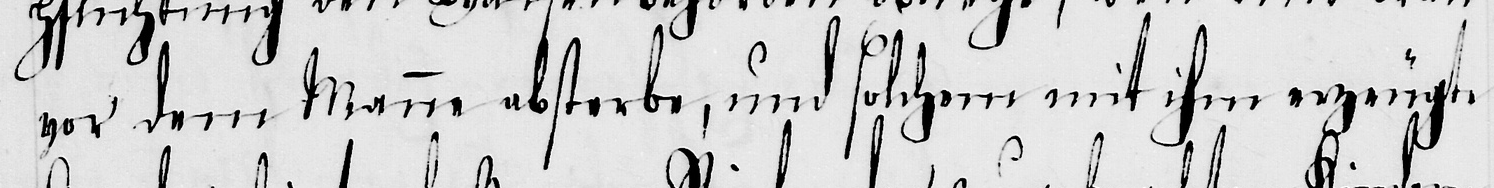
vor dem Manne absterbe, und solchem mit ihm erzeugte
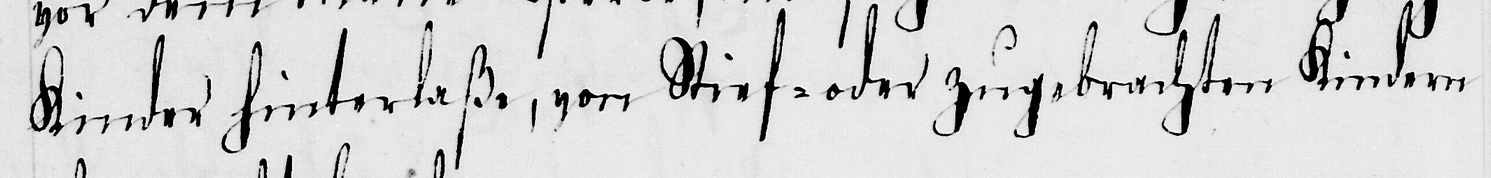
Kinder hinterlaße, von Stief- oder zugebrachten Kindern
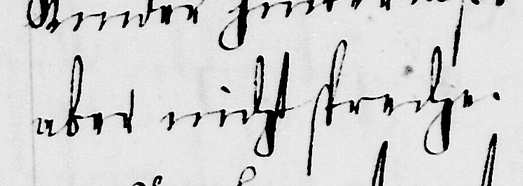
aber nicht spreche.
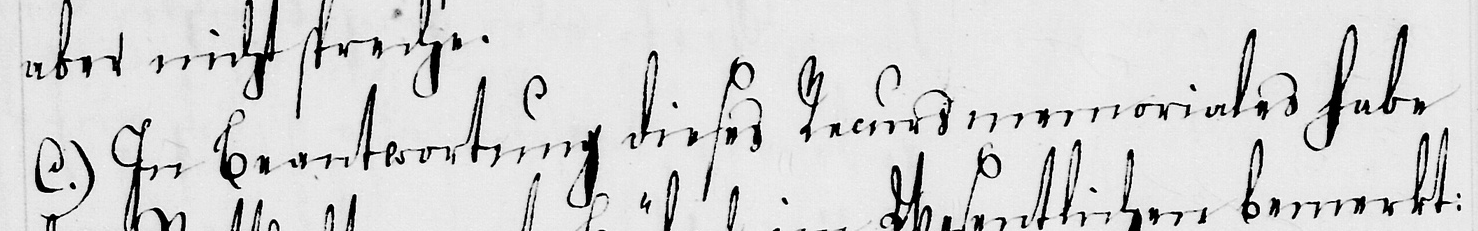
C.) In Beantwortung dieses Recursmemoriales habe
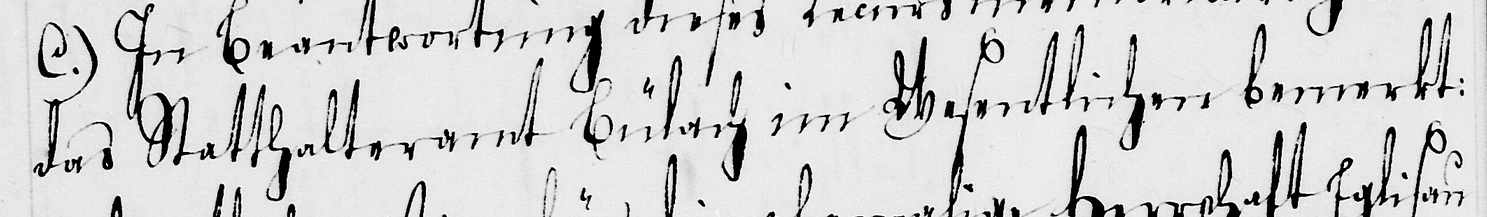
das Statthalteramt Bülach im Wesentlichen bemerkt:
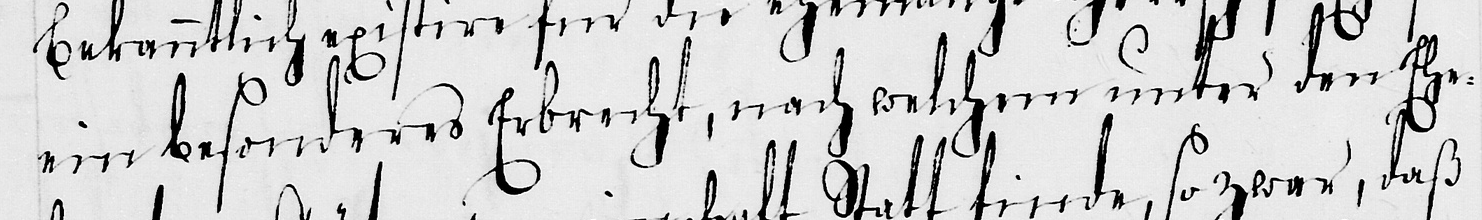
ein besonderes Erbrecht, nach welchem unter den Ehe¬
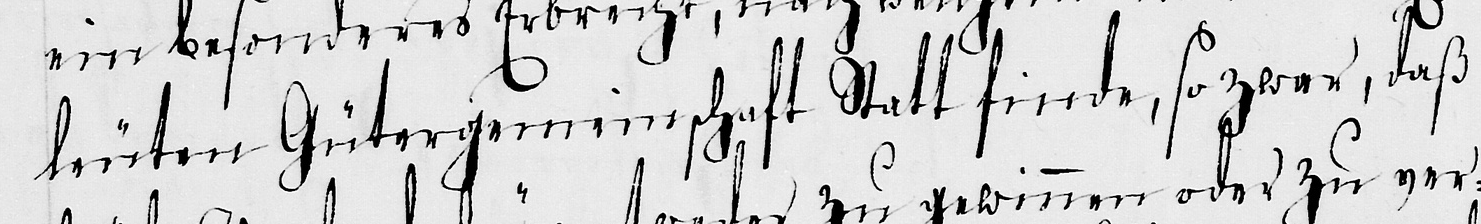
leuten Gütergemeinschaft Statt finde, so war, daß
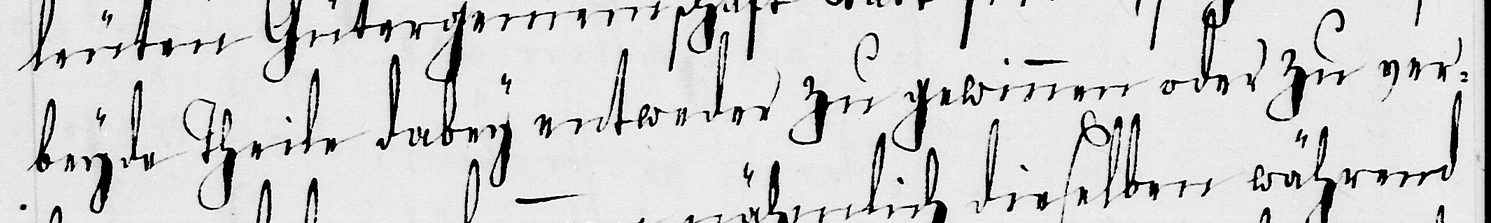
beyde Theile dabey entweder zu gewinnen oder zu ver¬
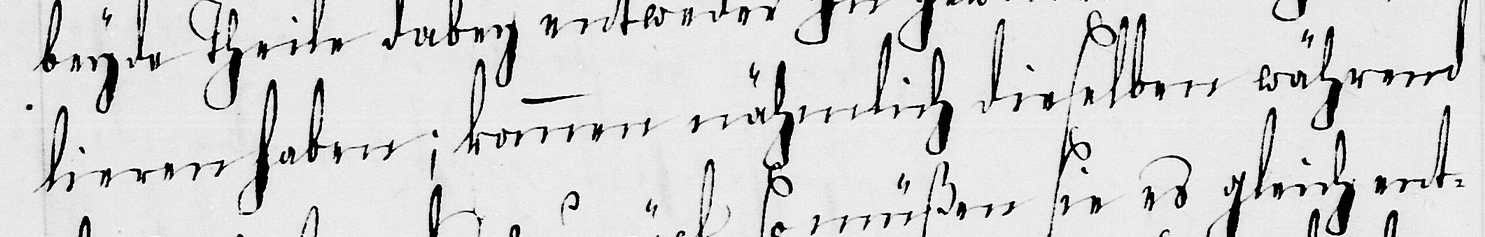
lieren haben; können nähmlich dieselben während
